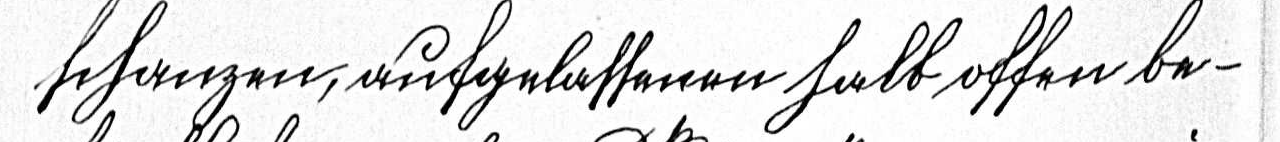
schanzen, aufgelassenen halb offen be¬
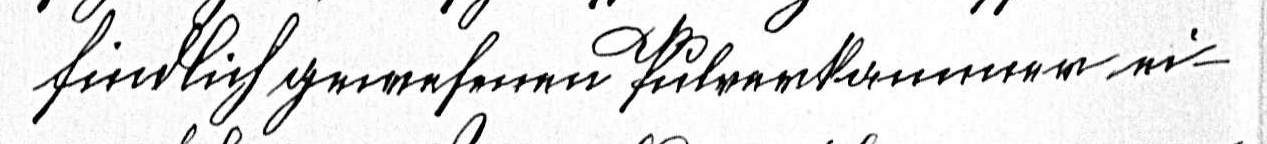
findlich gewesenen Pulverkammer ei¬
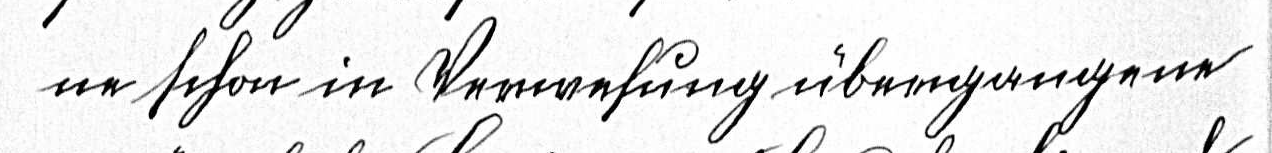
ne schon in Verwesung übergangenene
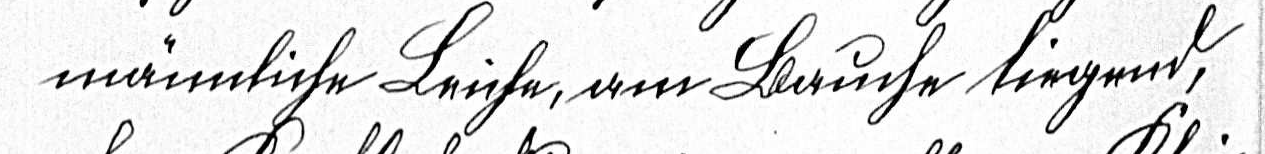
männliche Leiche, am Bauche liegend,
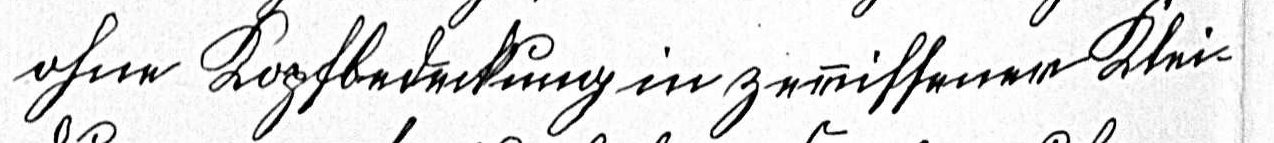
ohne Kopfbedeckung in zerissener Klei¬
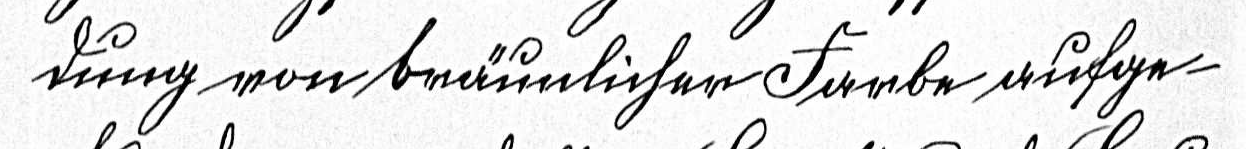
dung von bräunlicher Farbe aufge¬
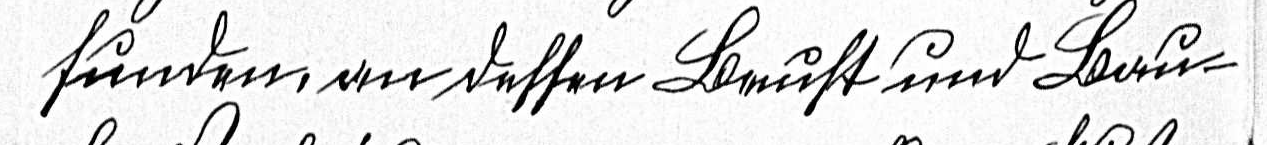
funden, an dessen Brust und Bau¬
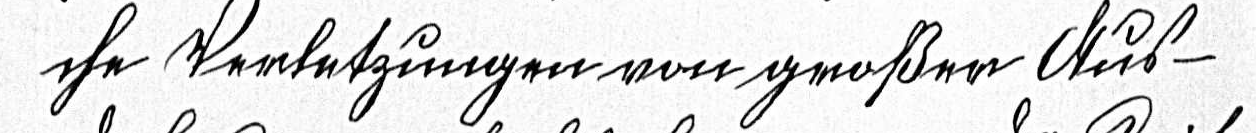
che Verletzungen von großer Aus¬
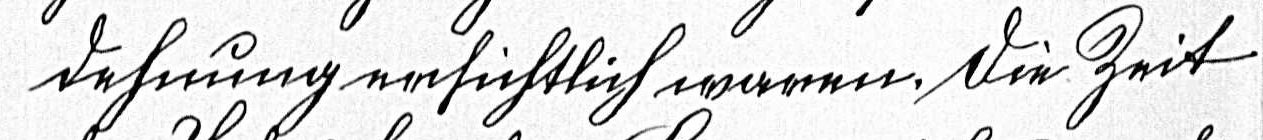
dehnung ersichtlich waren. Die Zeit
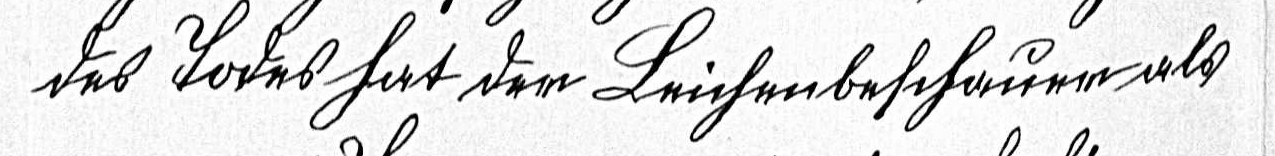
des Todes hat der Leichenbeschauer als
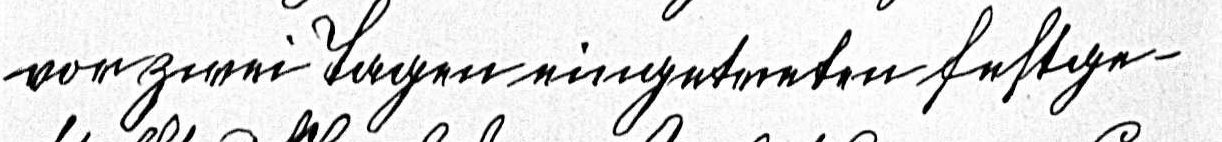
vor zwei Tagen eingetreten festge¬
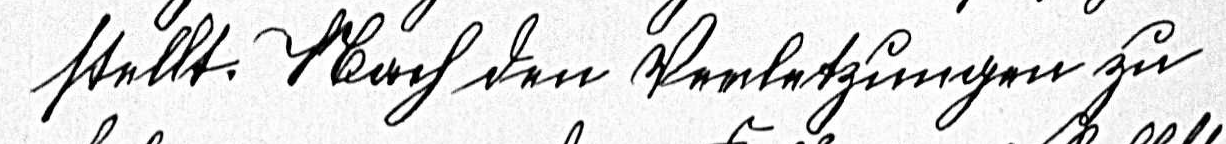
stellt. Nach den Verletzungen zu
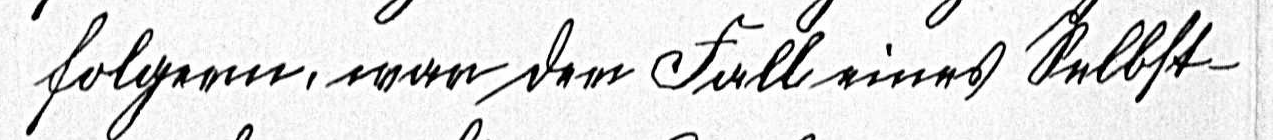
folgern, war der Fall eines Selbst¬
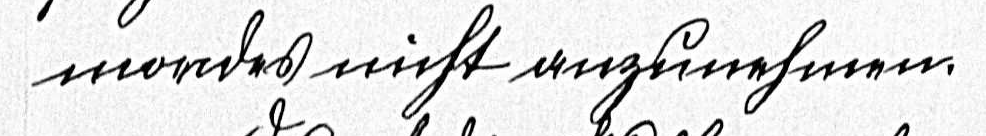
mordes nicht anzunehmen.
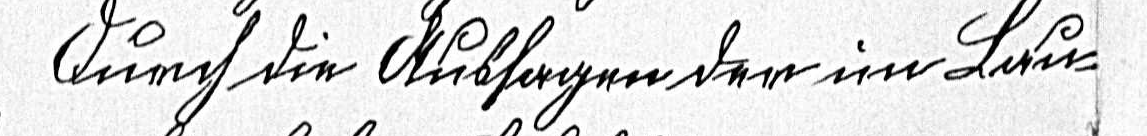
Durch die Aussagen der im Lau¬
